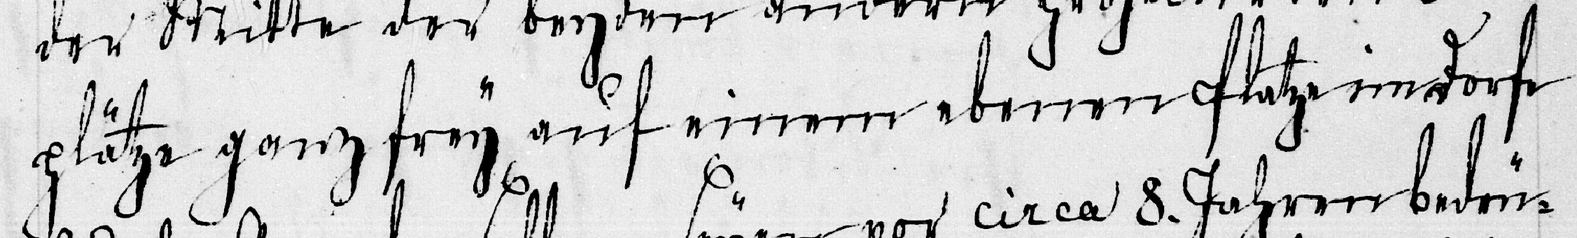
plätze ganz frey auf einem ebenen Platze im Dorfe
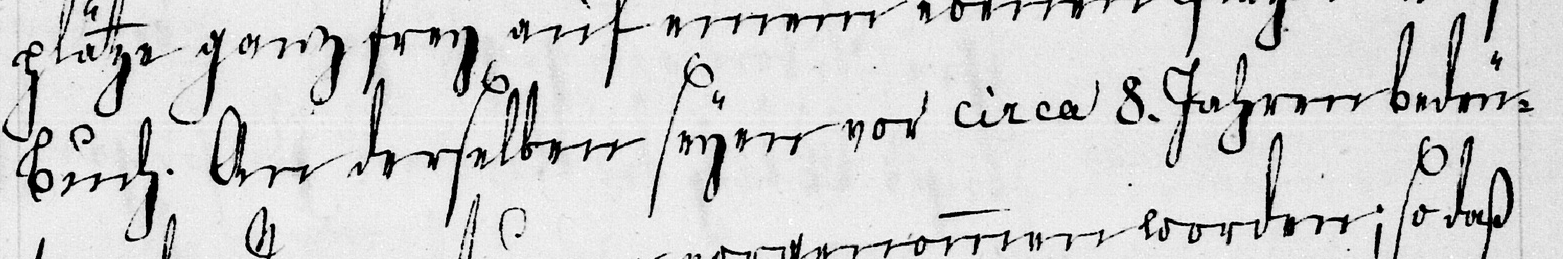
Buch. An derselben seyen vor circa 8. Jahren bedeu¬
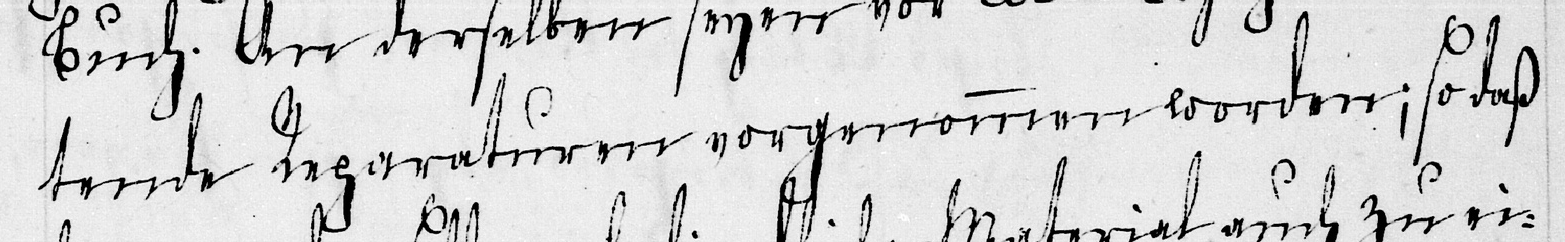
tende Reparaturen vorgenommen worden; so daß
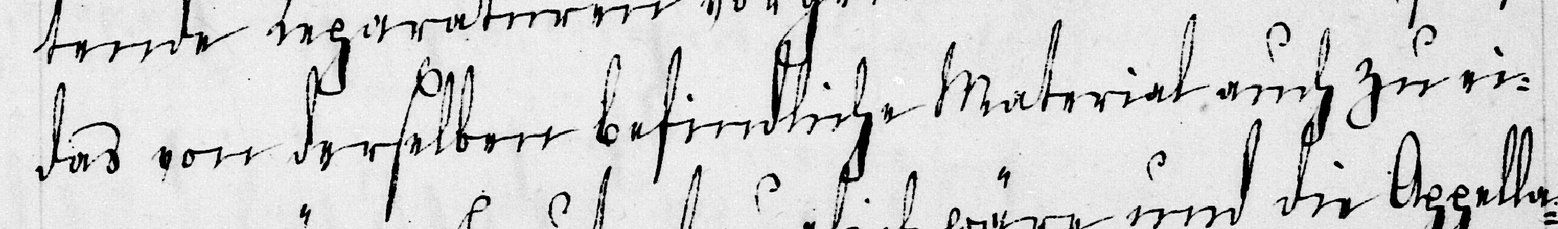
das von derselben befindliche Material auch zu ei¬
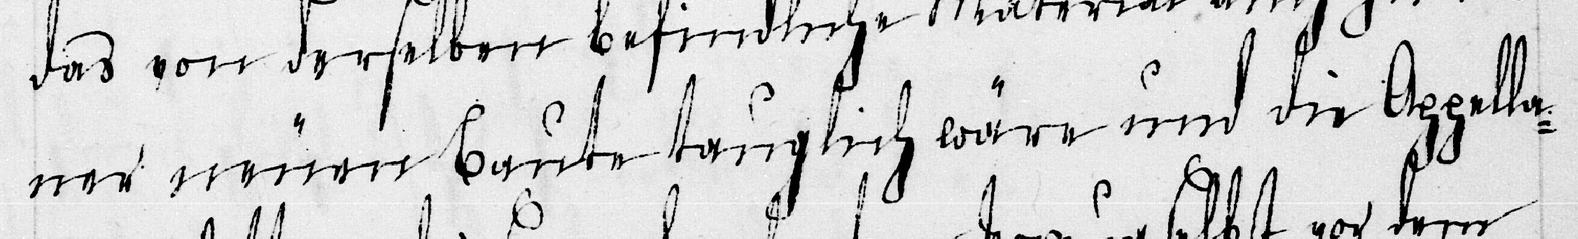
ner neuen Baute tauglich wäre und die Appella¬
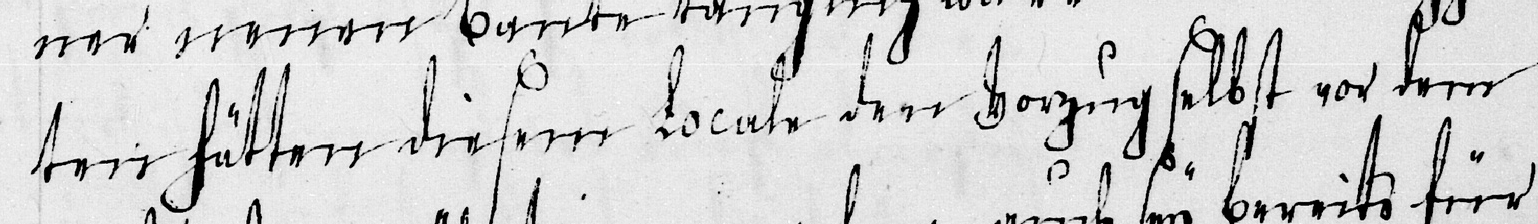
ten hätten diesem Locale den Vorzug selbst vor dem
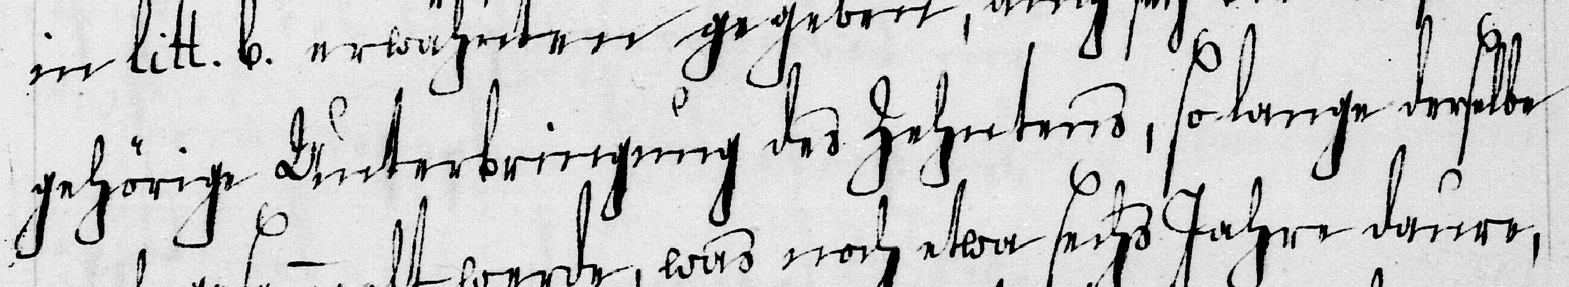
gehörige Unterbringung des Zehntens, so lange derselbe
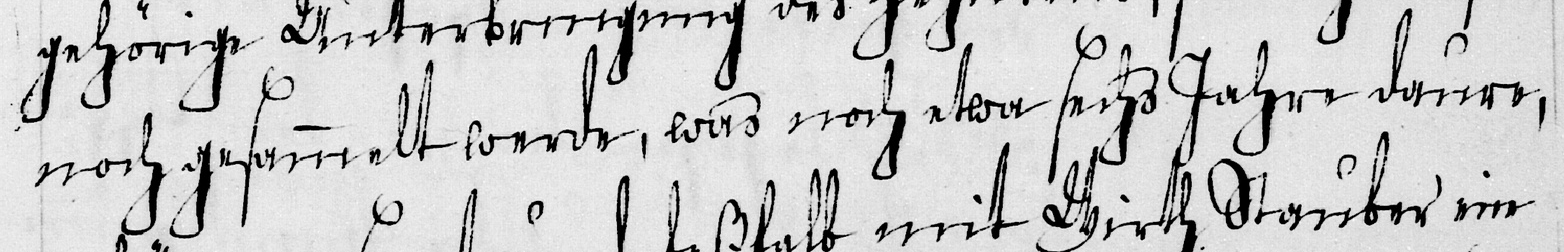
noch gesammelt werde, was noch etwa sechs Jahre daure,
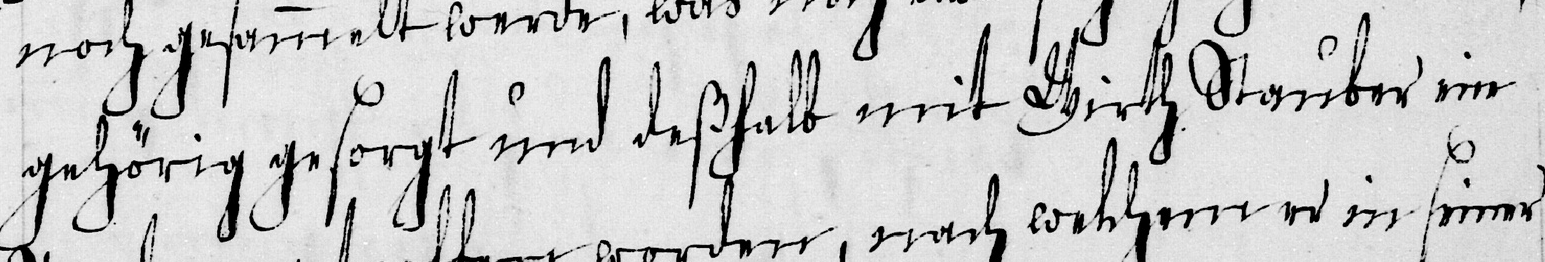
gehörig gesorgt und deßhalb mit Wirth Stauber ein
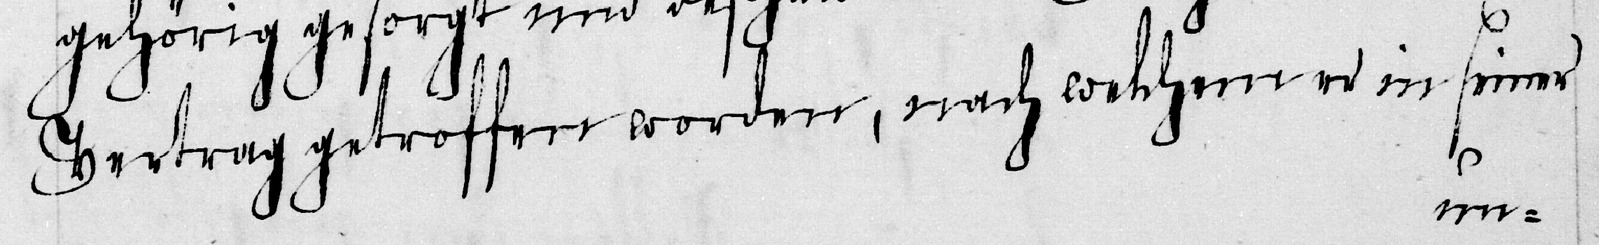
Vertrag getroffen worden, nach welchem er in seiner
